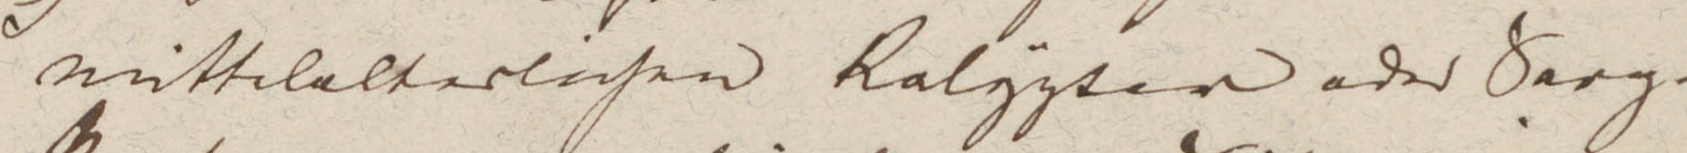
mittelalterlichen Kalypter oder Sarg-
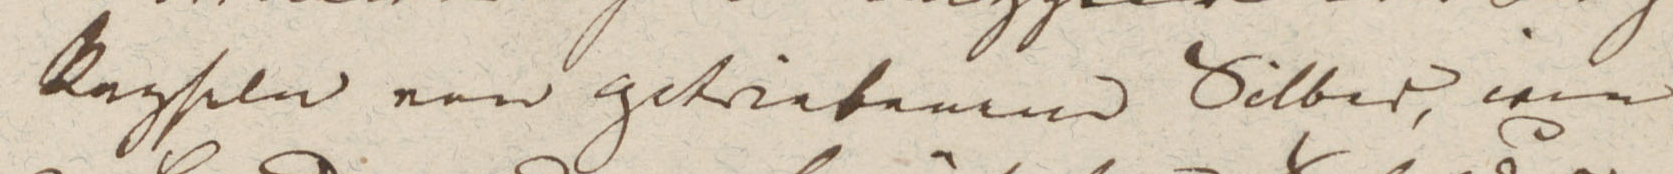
kapseln von getriebenem Silber, wie
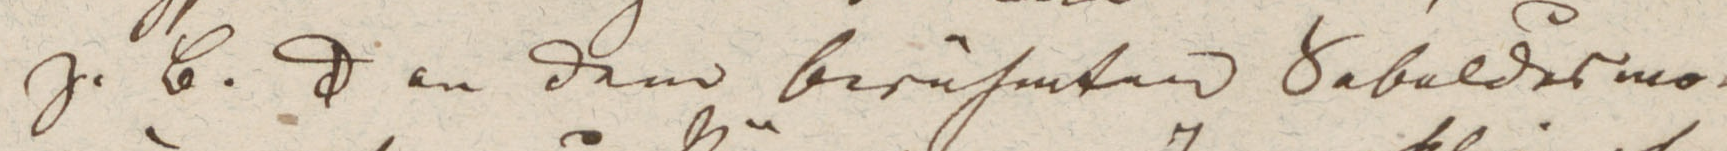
z. B. d an dem berühmten Sebaldusmo-
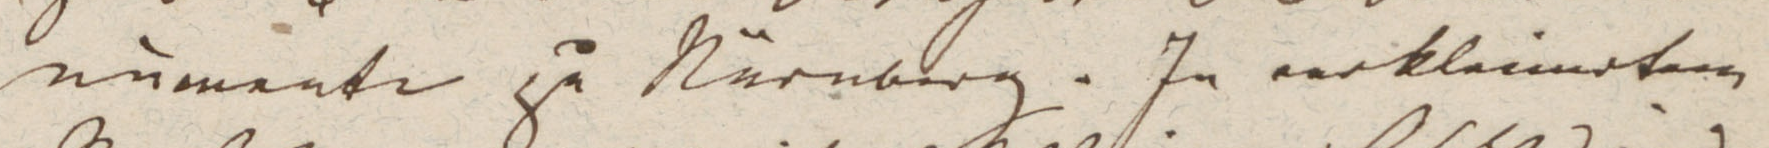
numente zu Nürnberg. In verkleinertem
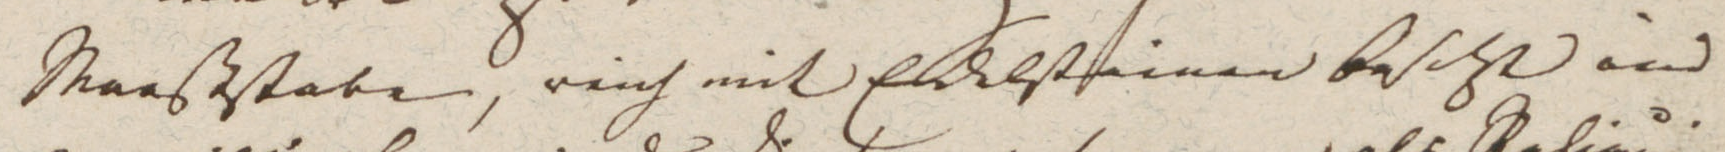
Maassstabe, reich mit Edelsteinen besetzt und
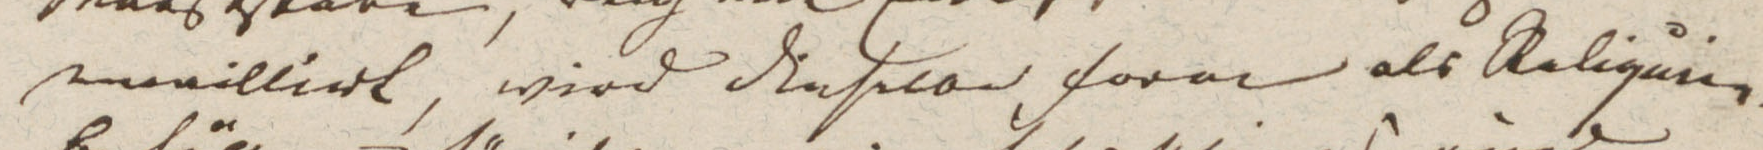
emaillirt, wird dieselbe Form als Reliquien-
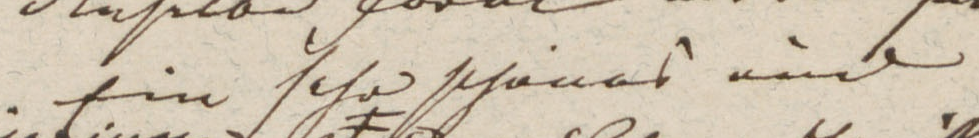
Ein sehr schönes und
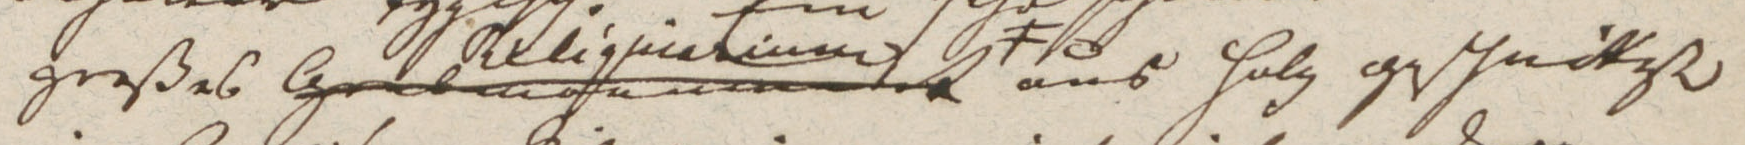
grosses Grabmonument Reliquiarium % aus Holz geschnitzt
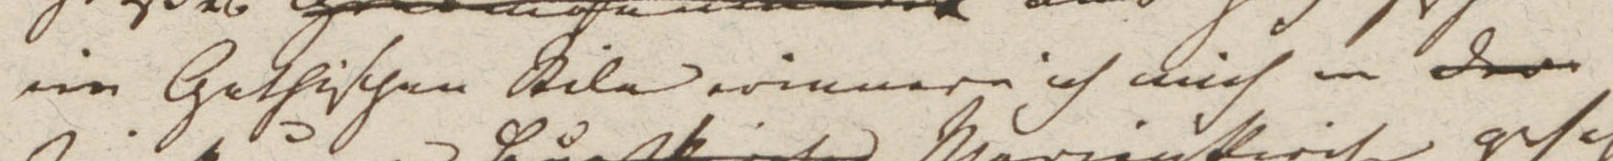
im Gothischen Stile erinnere ich mich an der
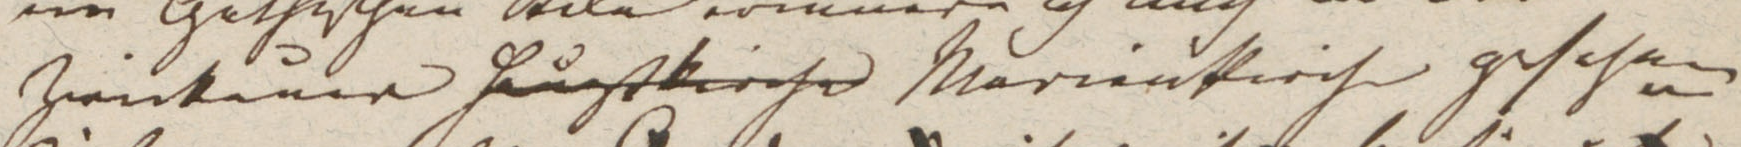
Zwickauer Hauptkirche Marienkirche gesehen
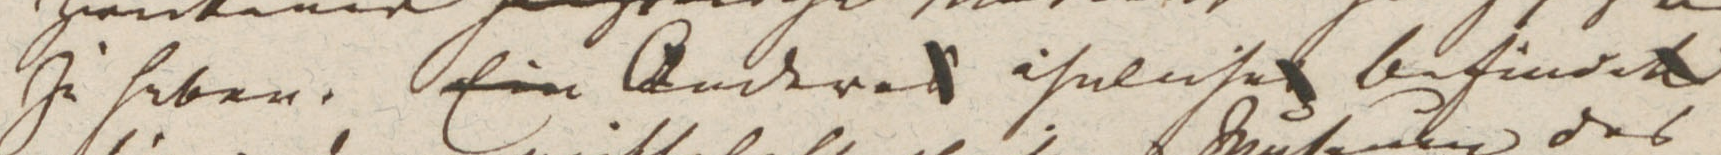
zu haben. Ein aAnderes ähnliches befindetn
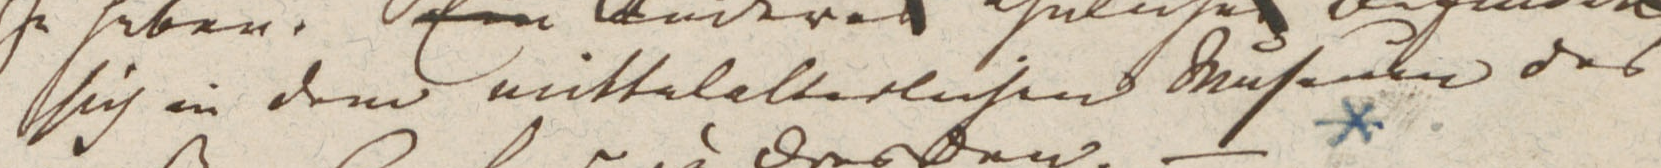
sich in dem mittelalterlichen Museum des
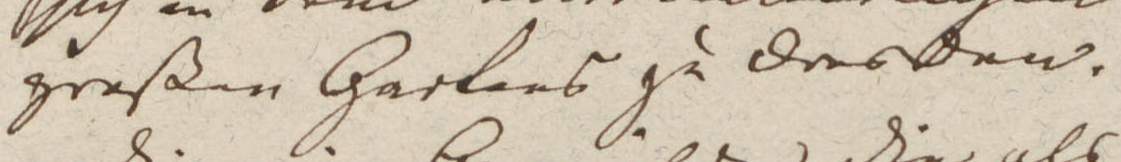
grossen Gartens zu Dresden. – %
